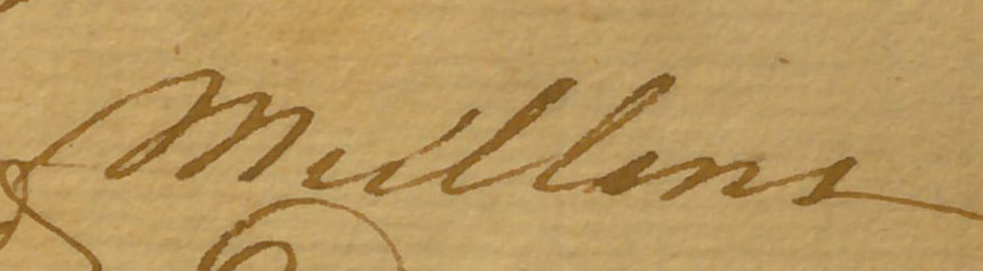Mullens
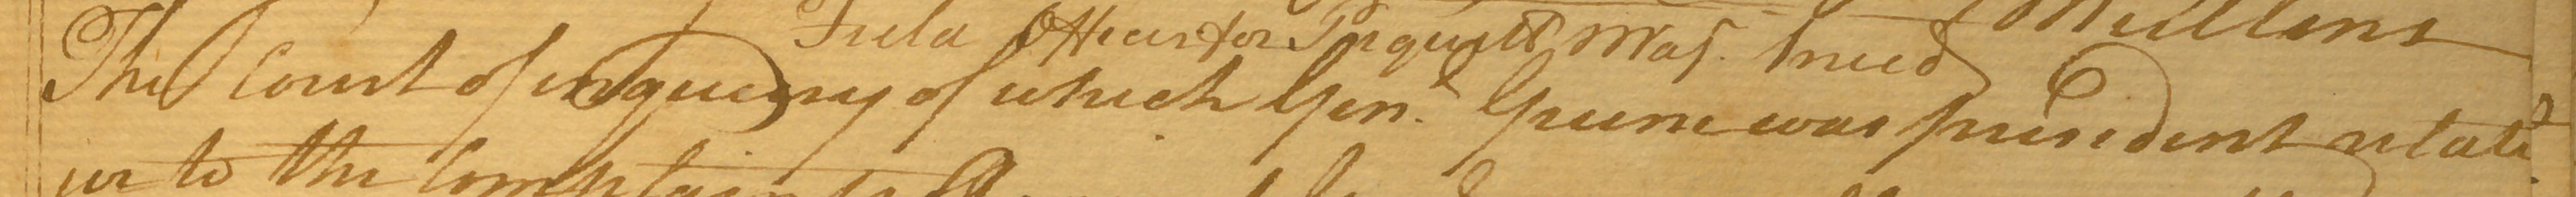The Court of enquiry of which Gen^l. Greene was president relati
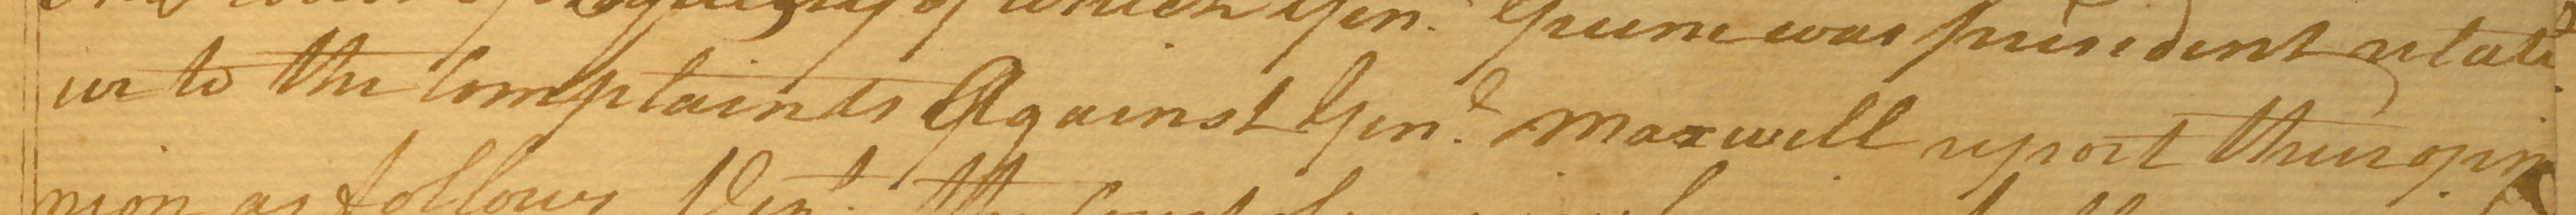ve to the Complaints against Gen^l. Maxwell report their opi
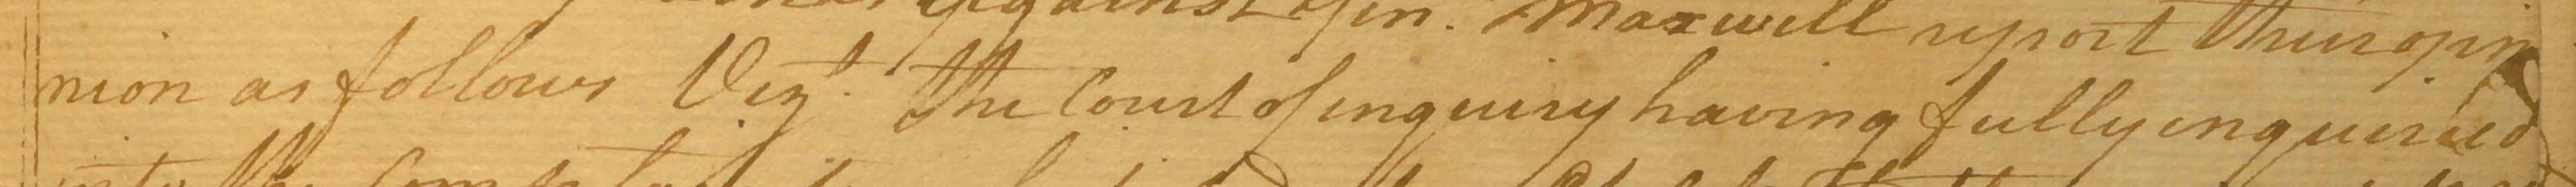nion as follows Viz^t. the Court of enquiry having fully enquired
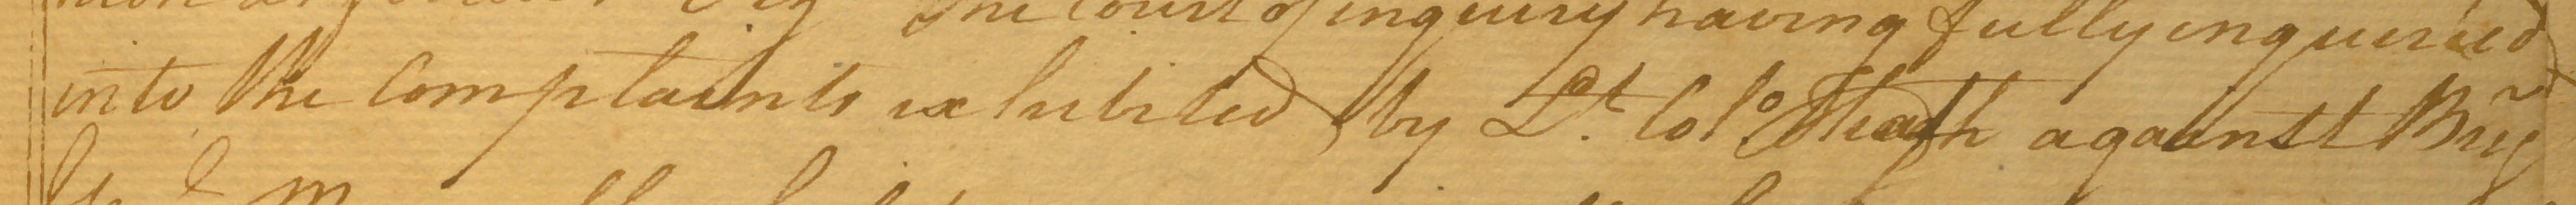into the Complaints exhibited by L^t. Col^o. Heath against Brig^r
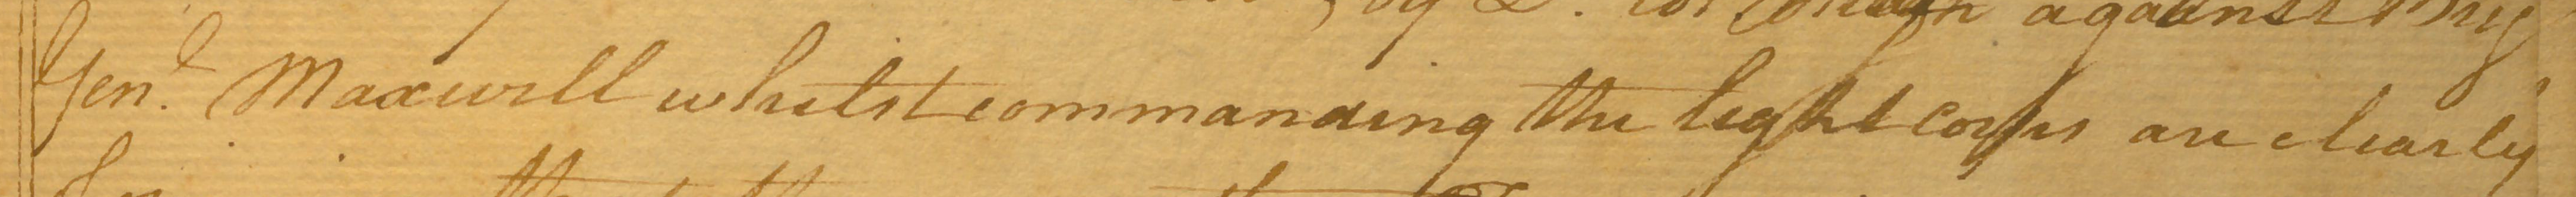Gen^l. Maxwell whilst commanding the light corps are clearly
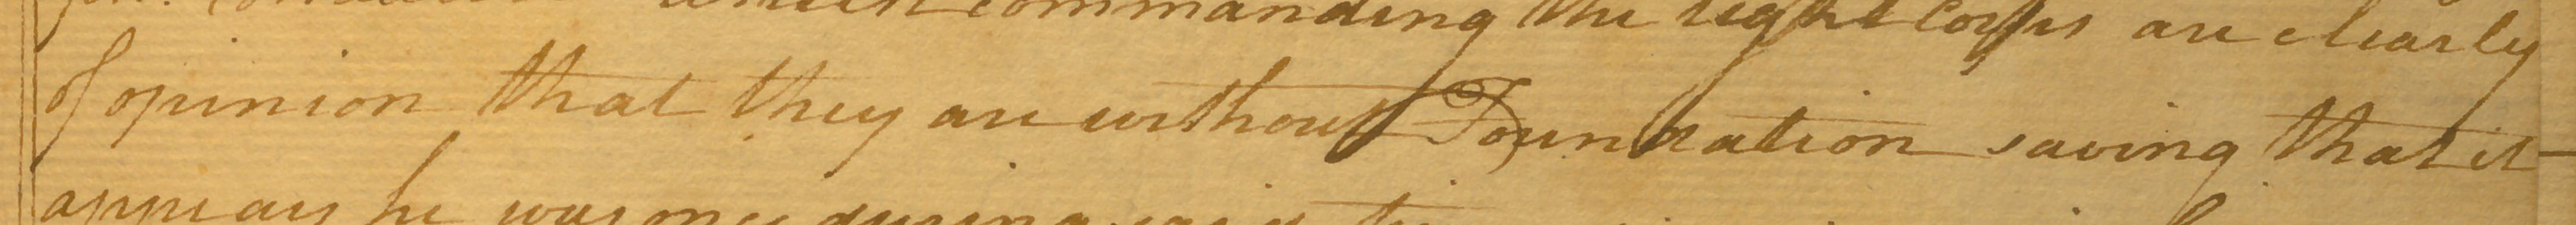of opinion that they are without Foundation saving that it
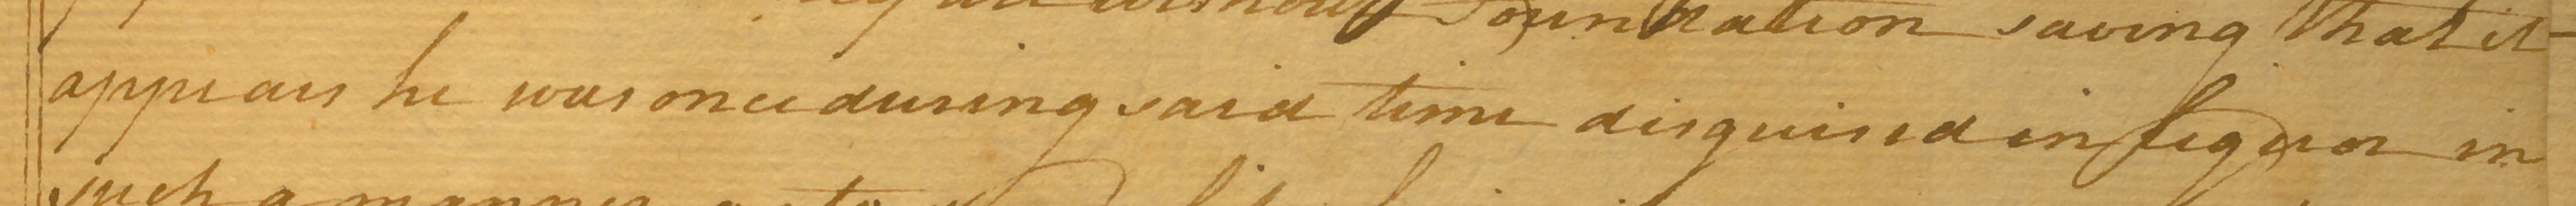appears he was once during said time disguised in liquor in
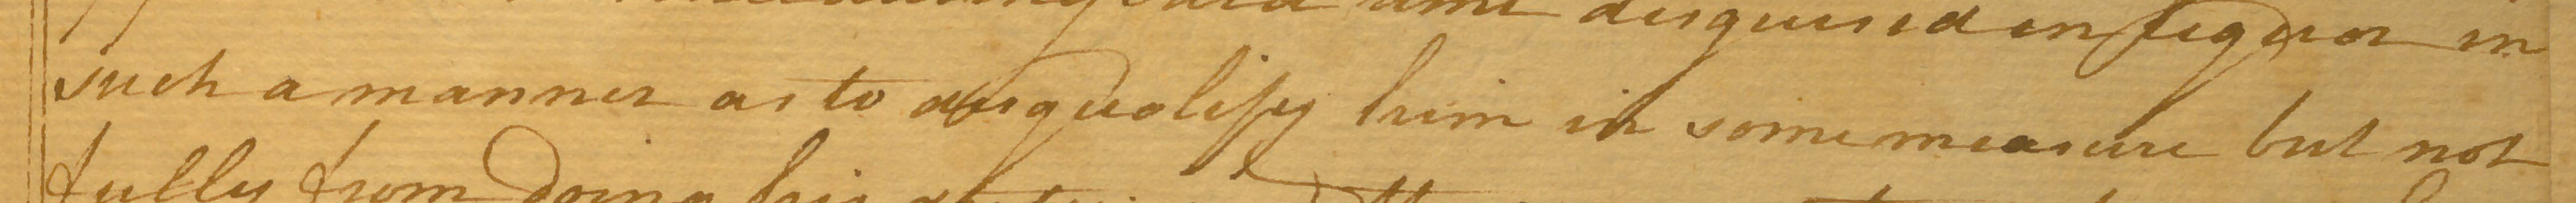such a manner as to disqualify him in some measure but not
